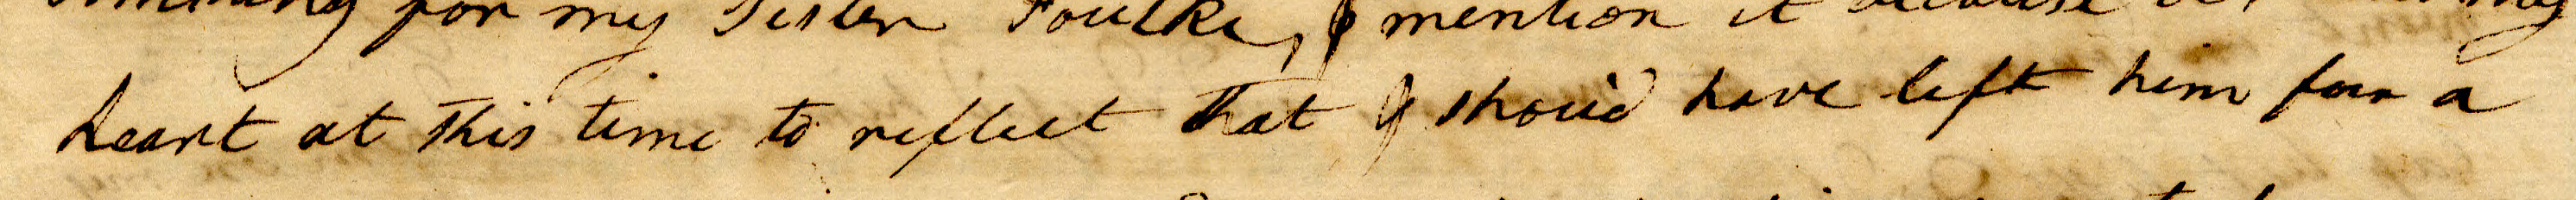heart at this time to reflect that I shou'd have left him for a
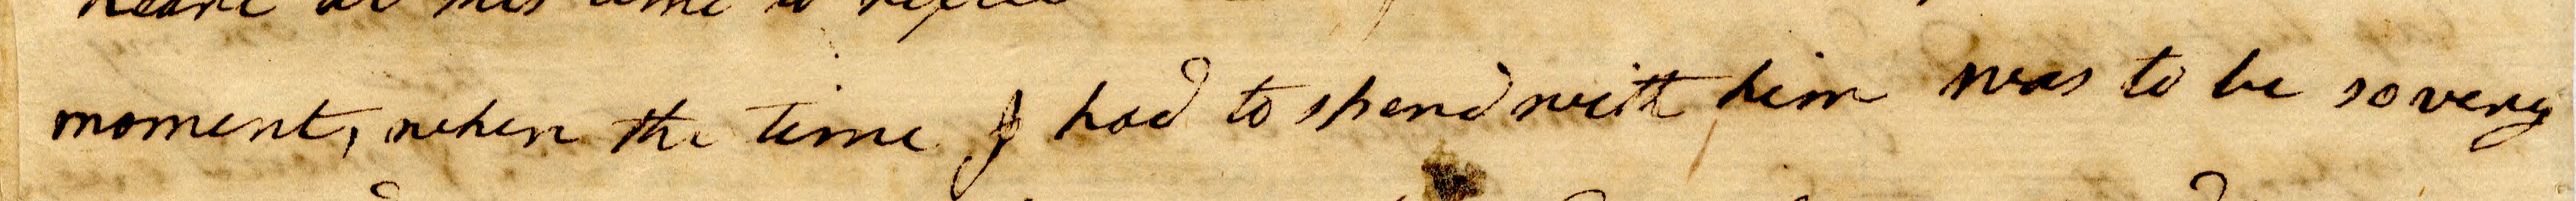moment, when the time I had to spend with him was to be so very
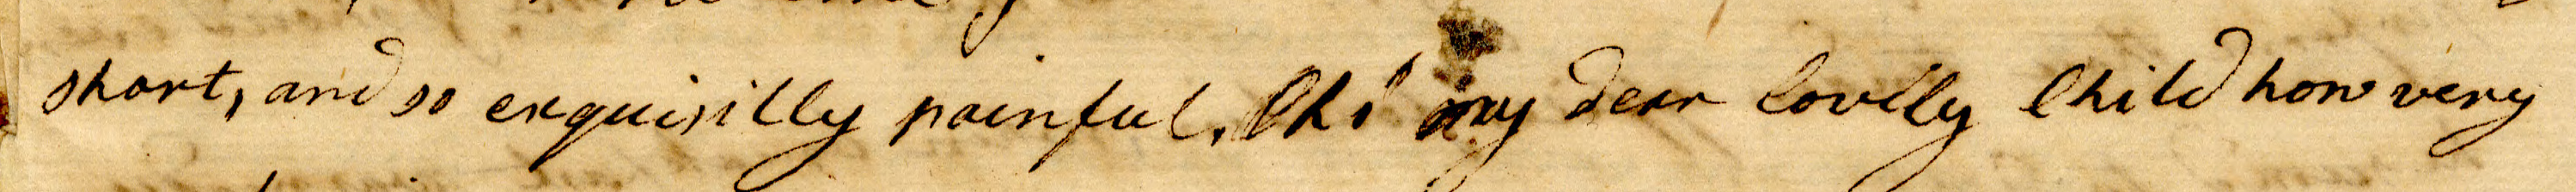short, and so exquisitly painful, my dear lovely Child how very
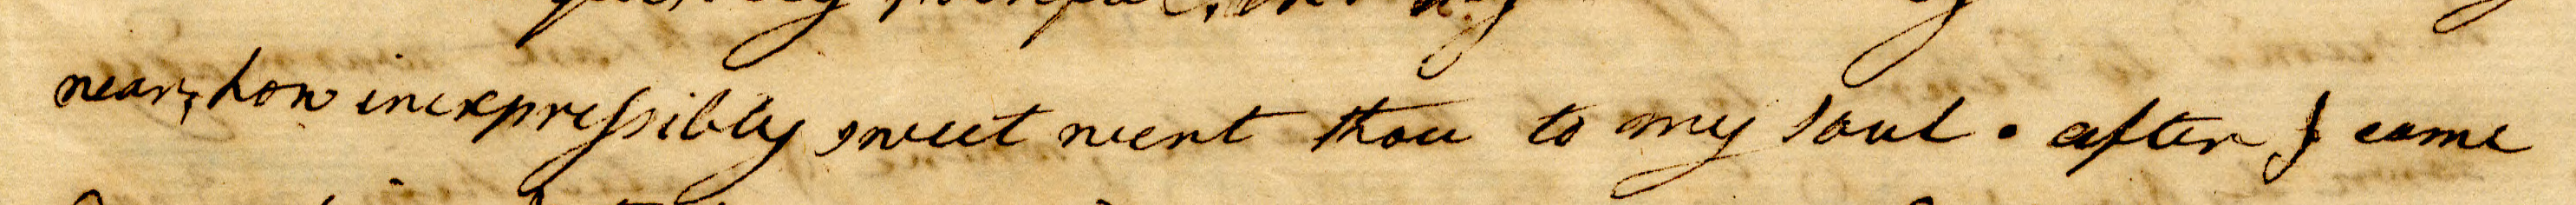near, how inexpressibly sweet wert thou to my soul. after I came
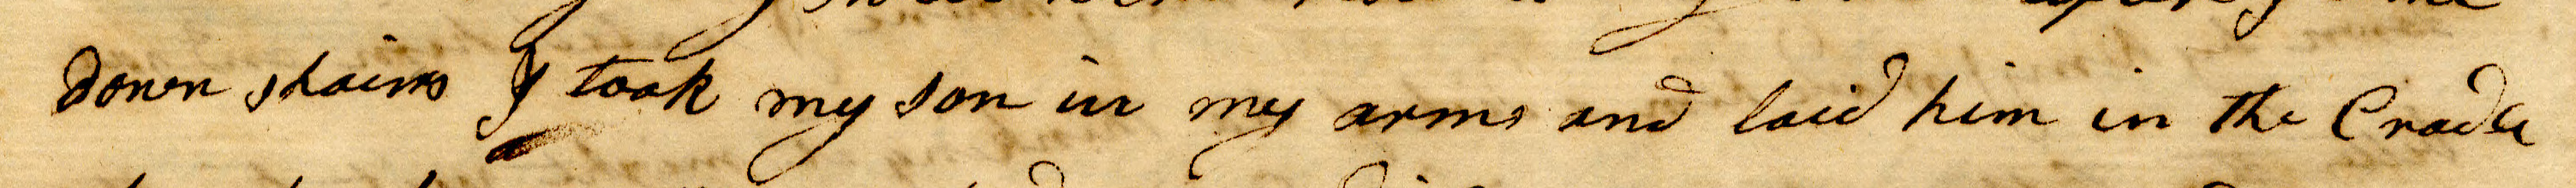down stairs I took my son in my arms and laid him in the Cradle
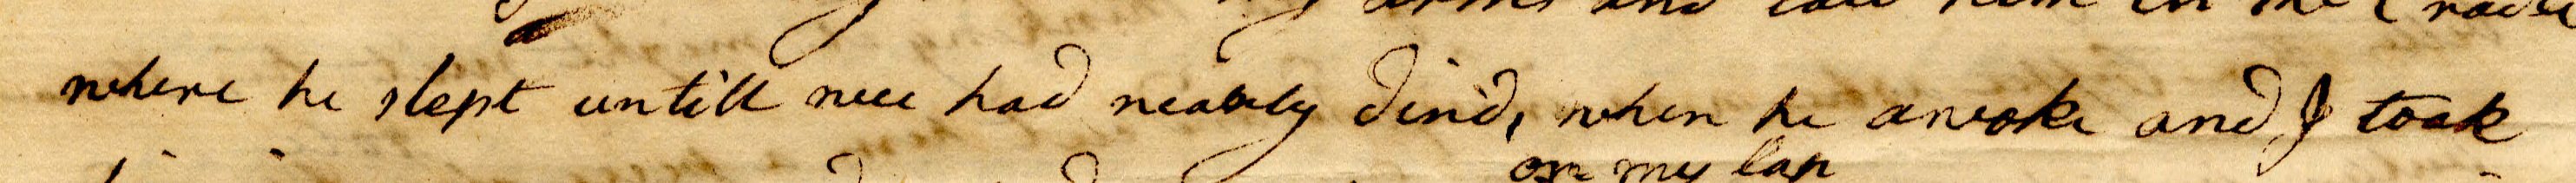where he slept until wee had nearly din'd, when he awoke and I took
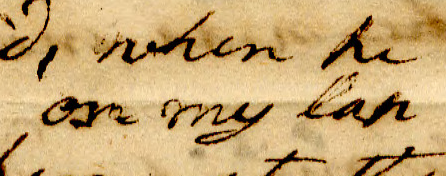on my lap
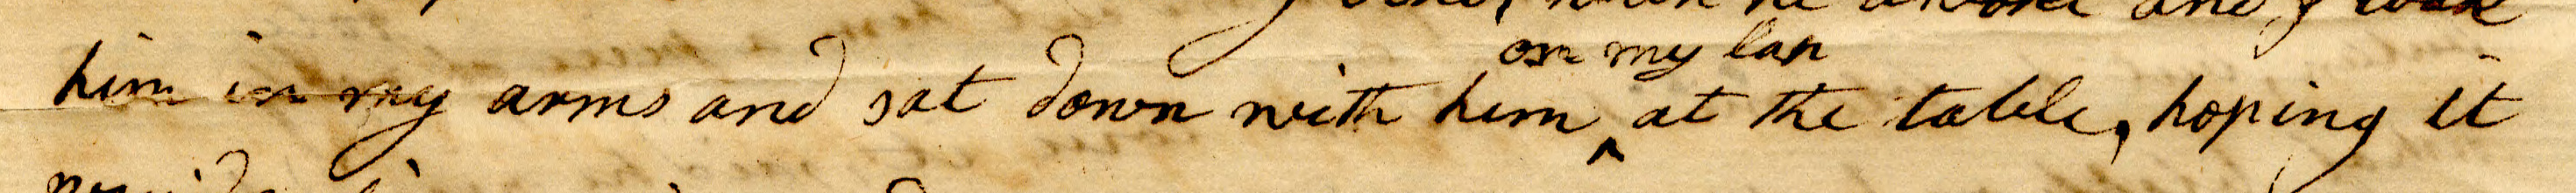him in my arms and sat down with him ^ at the table, hoping it
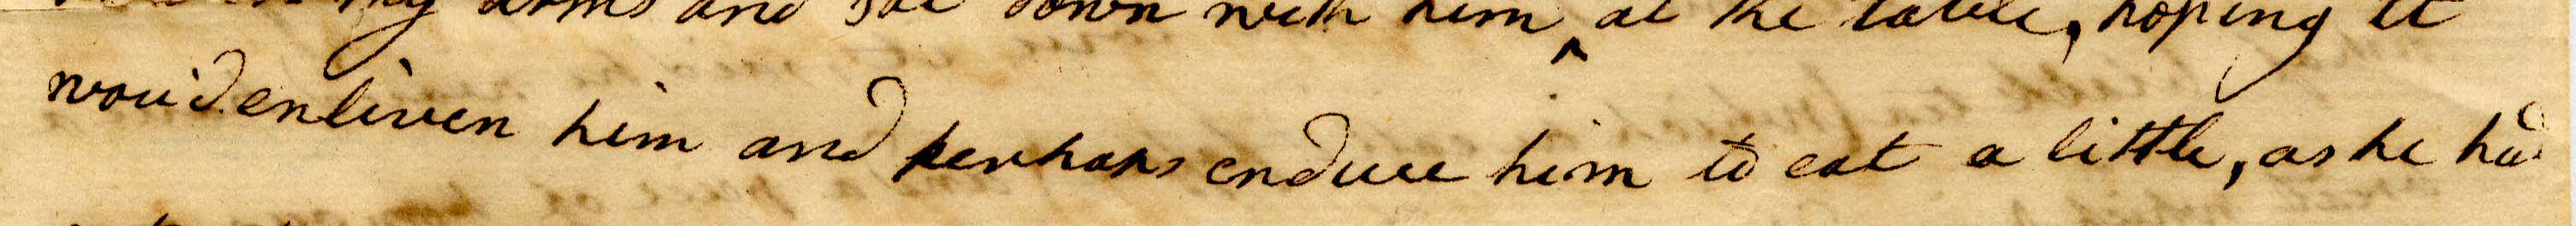wou'd enliven him and perhaps endure him to eat a little, as he had
